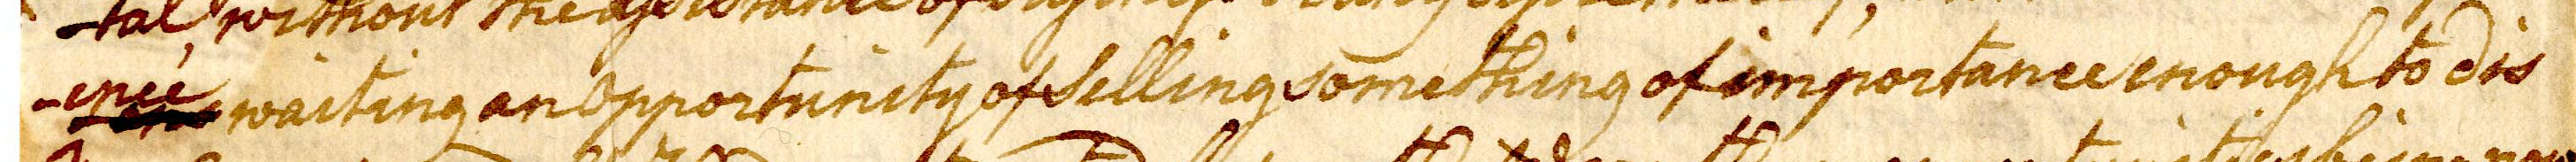-ence waiting an opportunity of selling something of importance enough to dis
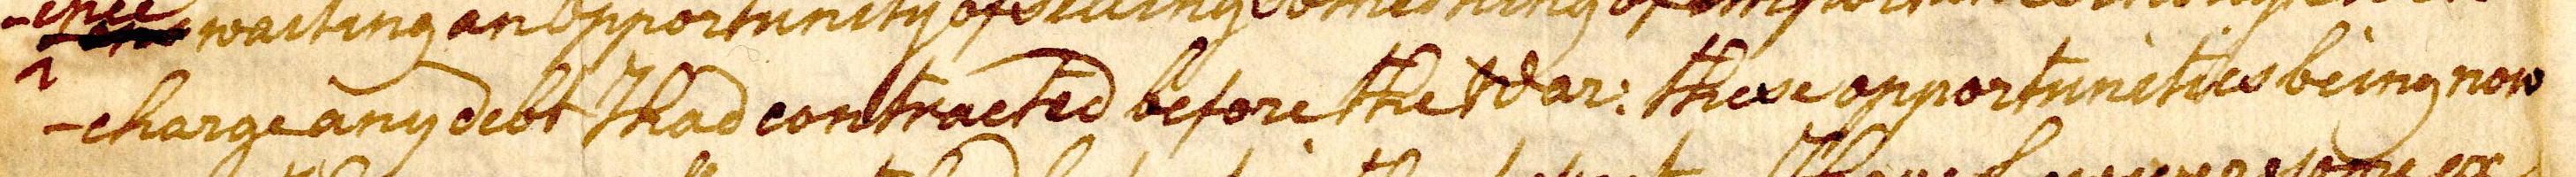-charge any debt I had contracted before the War: These opportunities being now
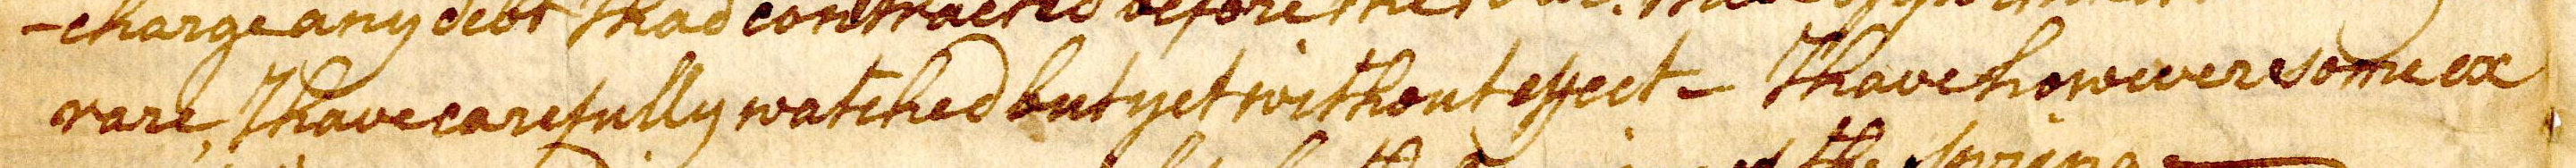rare, I have carefully watched but yet without effect- I have however some ex
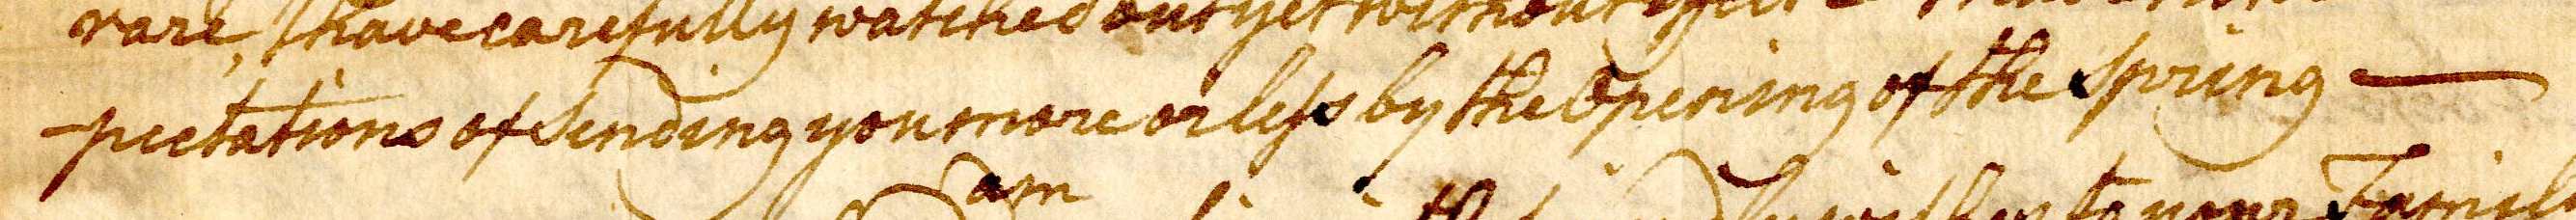-pectations of sending you more or less by the opening of the Spring-
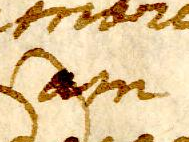am
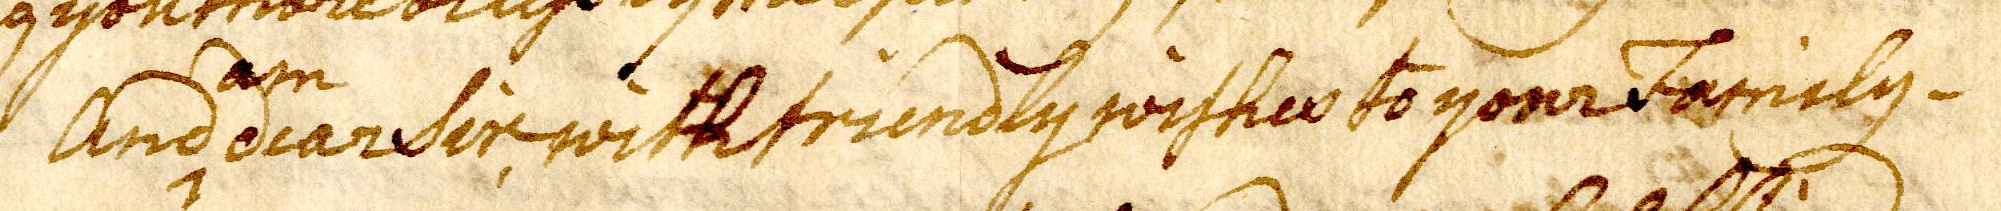And dear Sir, with friendly wishes to your Family-
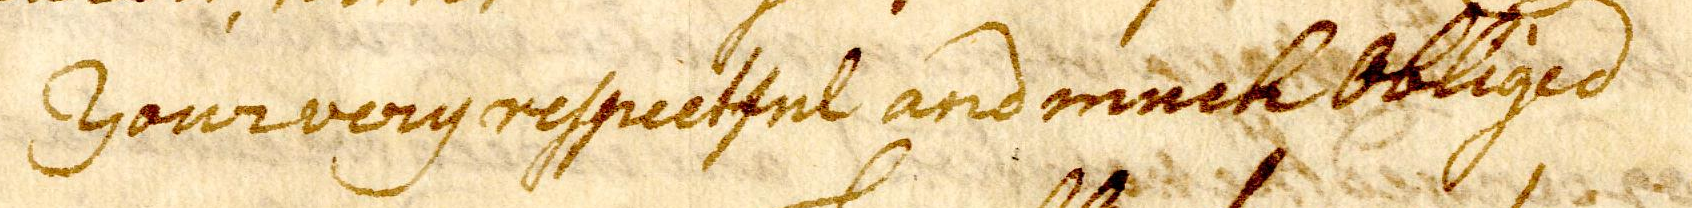Your very respectful and much Obliged
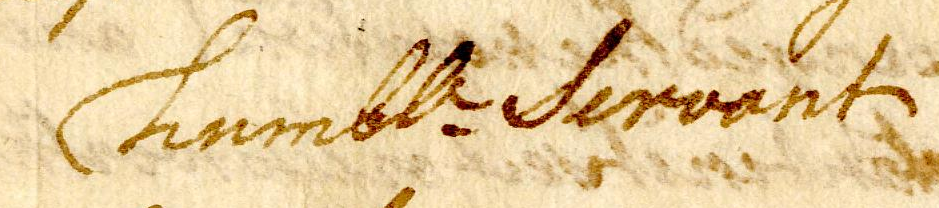humb^le. Servant
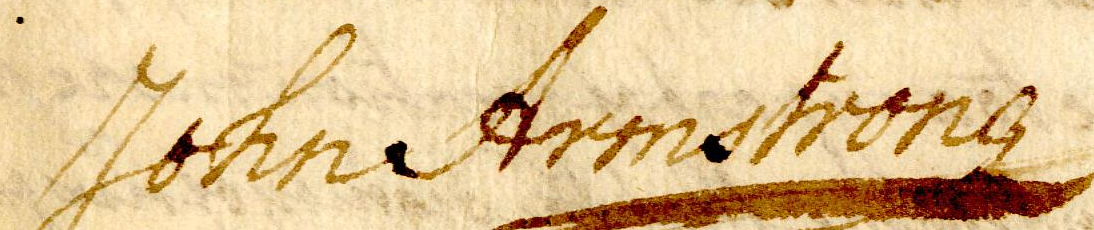John Armstrong
